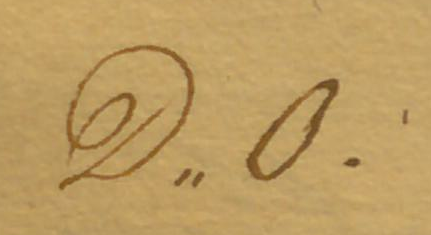D.O.
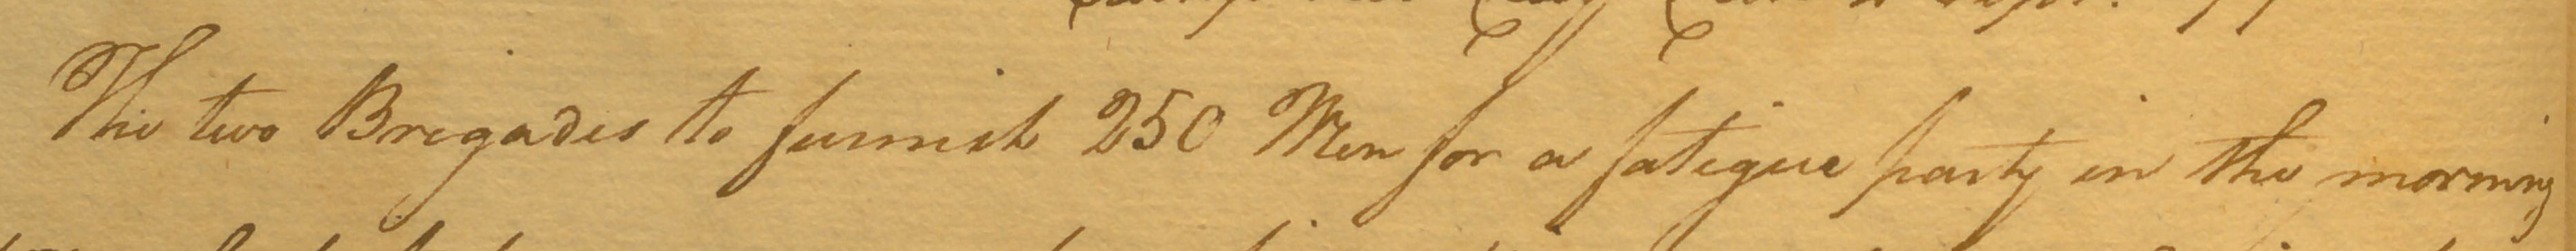The two Brigades to furnish 250 Men for a fatigue party in the morning
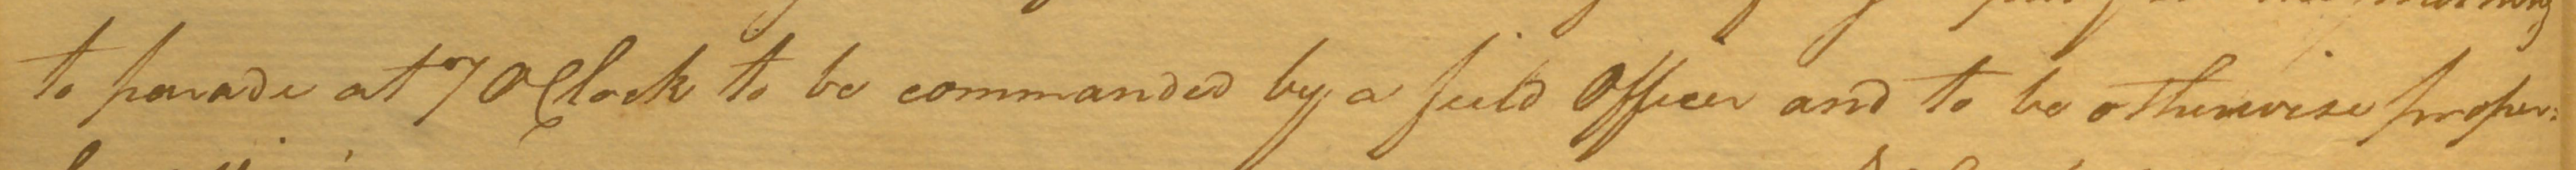to parade at 7 oClock to be commanded by a field Officer and to be otherwise proper-
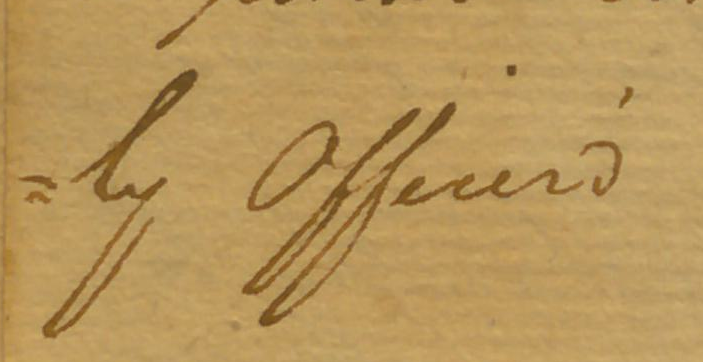-ly Officer'd
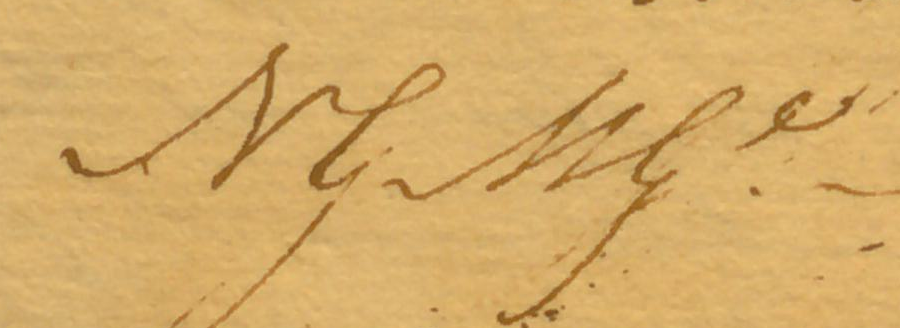NG MG^l.
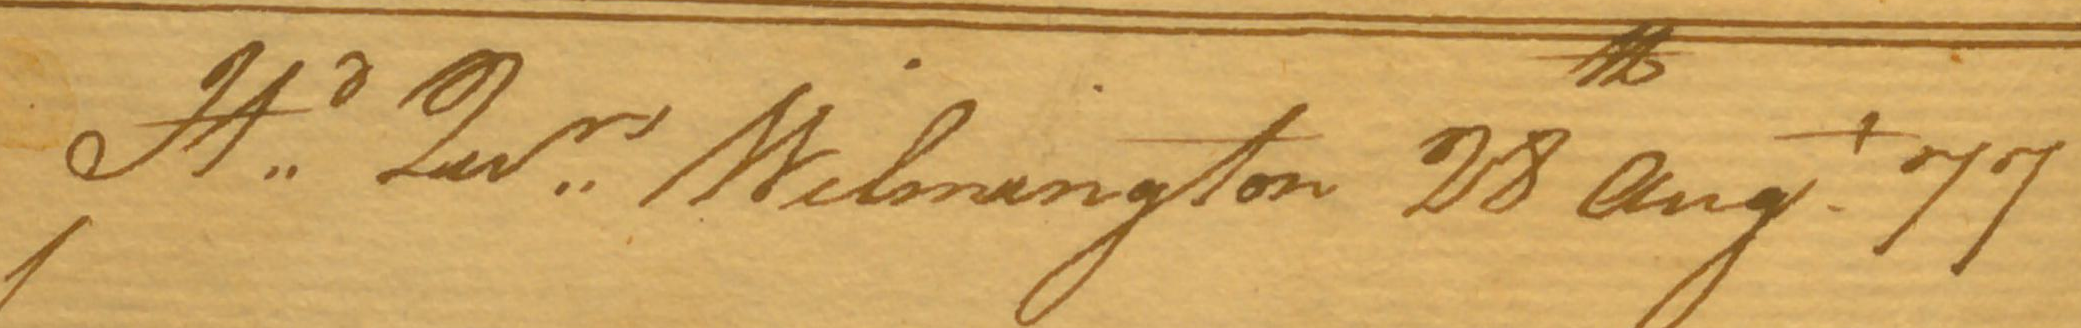H^d. Qu^rs. Wilmington 28^th Aug^t. 77
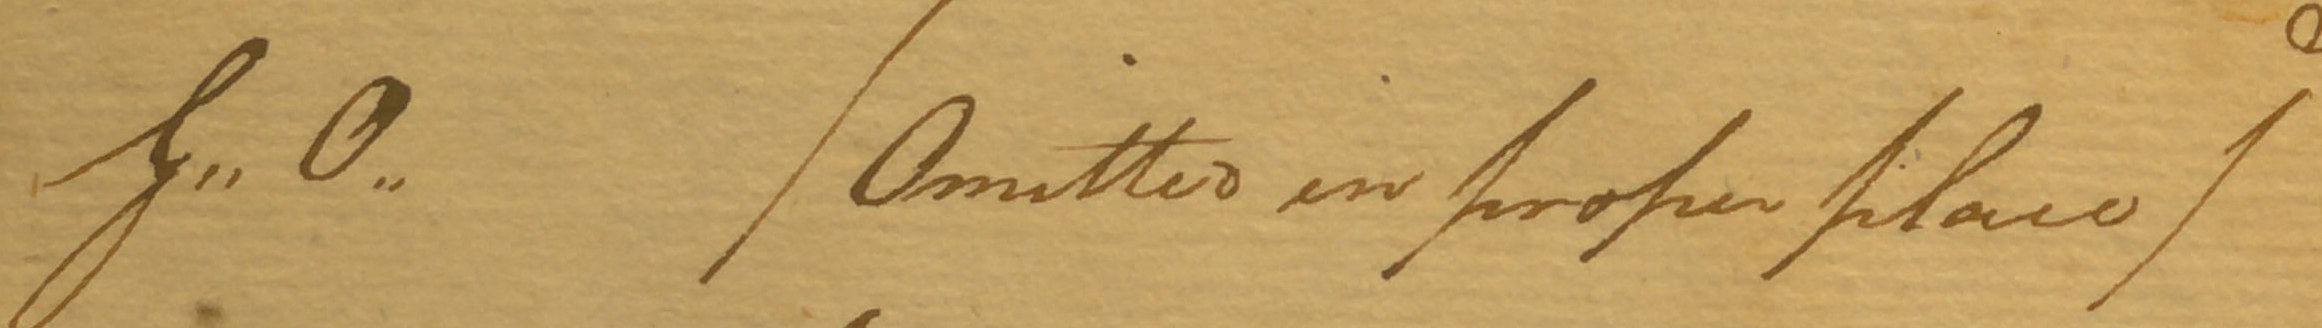G.O. /Omitted in proper place/
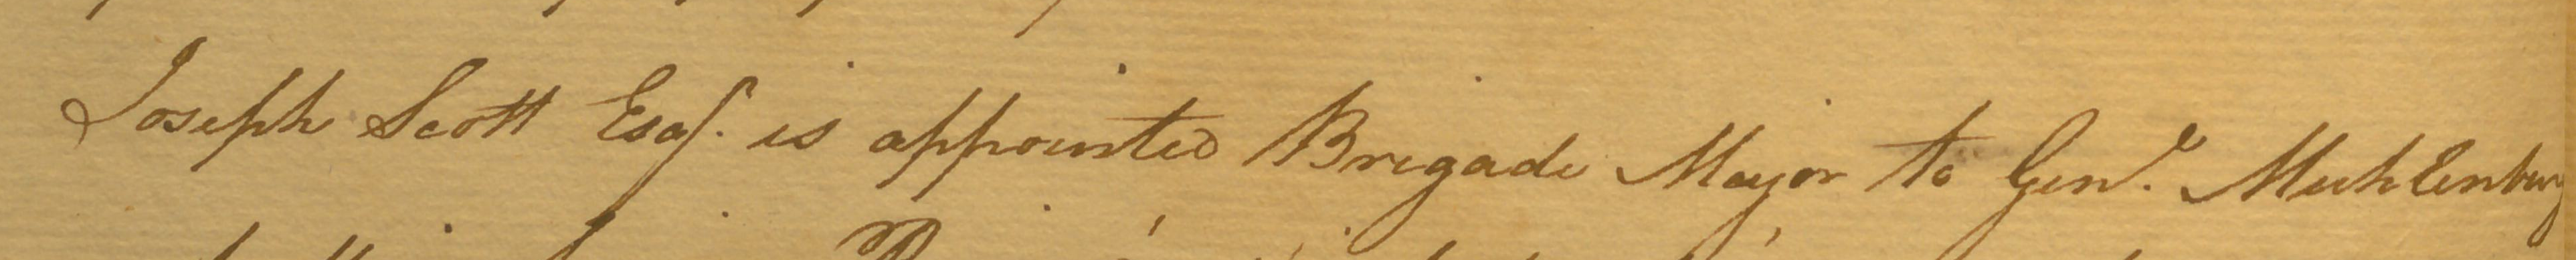Joseph Scott Esq^r. is appointed Brigade Major to Gen^l. Muhlenburg
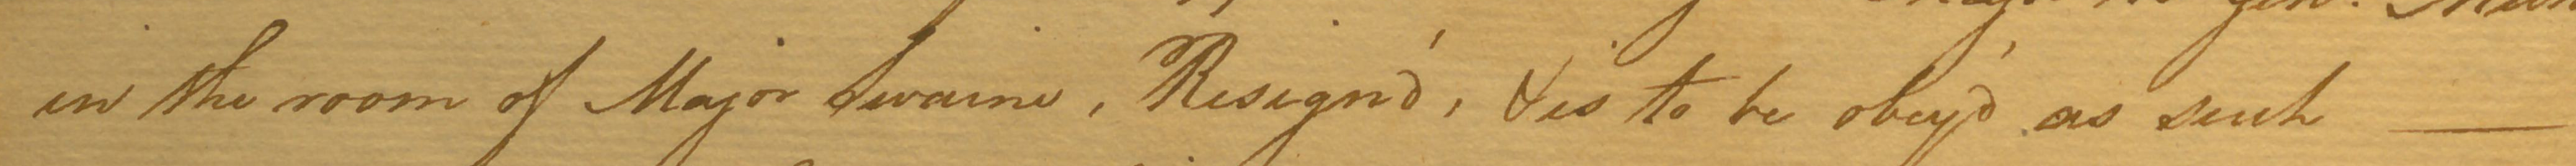in the room of Major Swaine, Resign'd, & is to be obey'd as such-
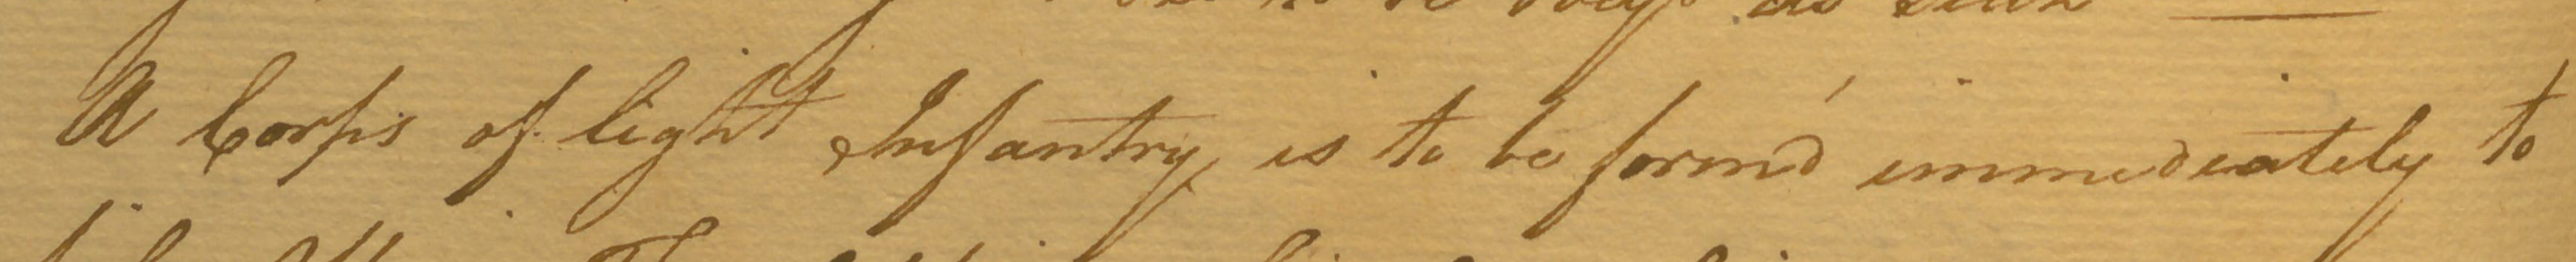A Corps of light Infantry is to be form'd immediately to
